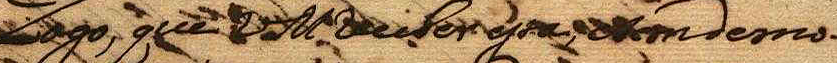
Logo, que VM Receber esta, e sem demo
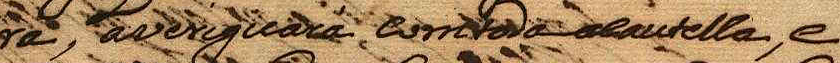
ra, averiguará com toda a cautella, e
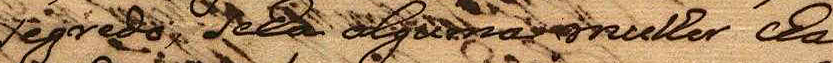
segredo, se ha alguma mulher cha
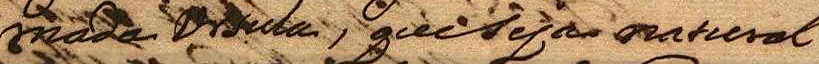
mada Vrsula, que seja natural
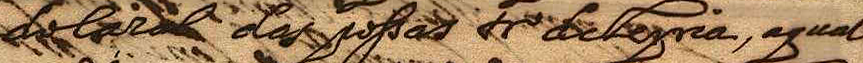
do Cazal dos possas tr.o de Leyria, a qual
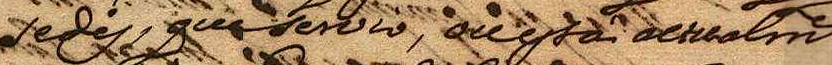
se dis, que servio, ou esta actualmte
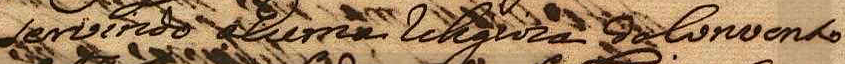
servindo a huma Religioza do Convento
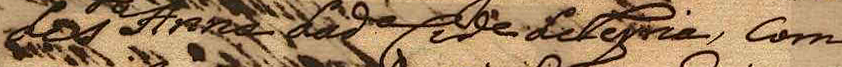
de Sta Anna da da Cide de Leyria, com
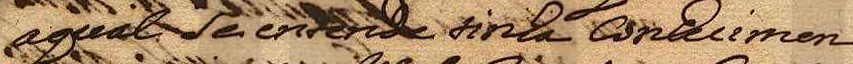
a qual se entende tinha conhecimen
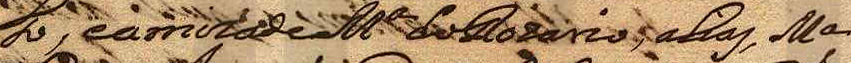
to, e amizade Ma do Rozario, alias, Ma
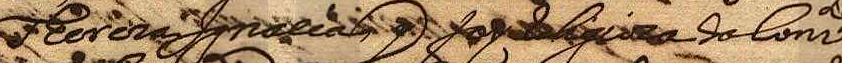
Thereza Jgnacia q̄. foy Religioza do Convto
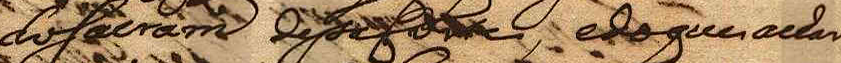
do sacramto desa Corte, e do que achar
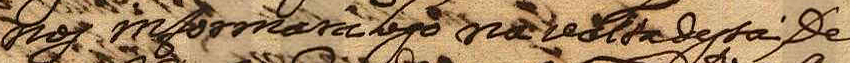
nos informara Logo na volta desta De
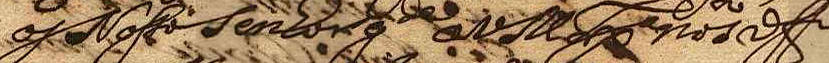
os Nosso Senhor gde a vM Lxa no sto Offo
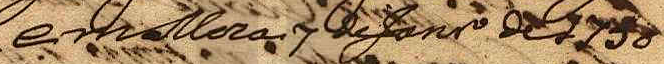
em Meza 7 de Janro de 1750
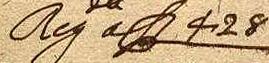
Regda a fl 428
